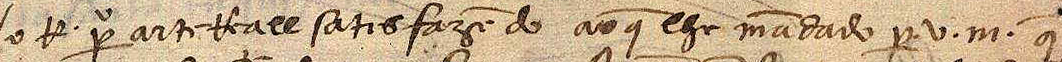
o R. ꝑo corte Reall satisfazēdo ao q̄ lhe mādado ꝑ. v. m. q̄
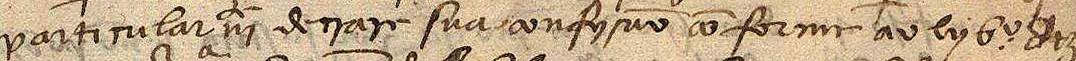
particularmte decrare sua confysão c̄oforme ao lybo: diz
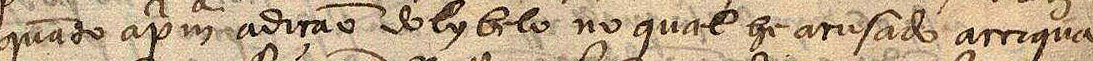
qūato a pima adição do lybelo no qual he acusado acerqua
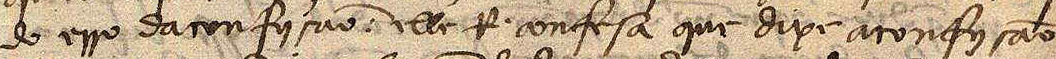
do erro da confysaõ : elle R. confesa que dixe a confysão
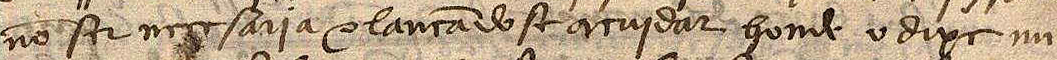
n̄o ser necesarja e lanc̄ado se a cujdar honde o dixe me
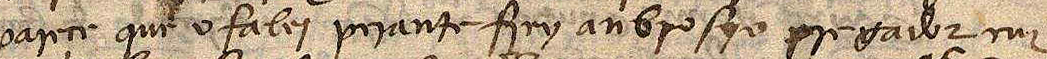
pareçe que o falej perante frey anbrosyo pregador em
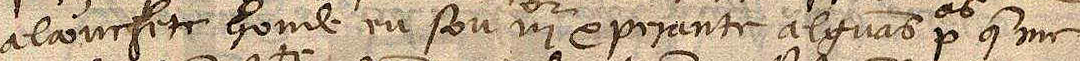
alcouchete honde eu sou mor e perante algūas pas q̄ me
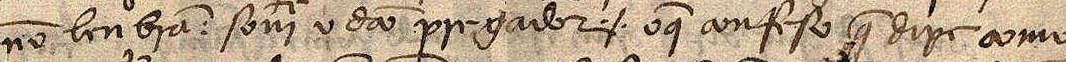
n̄o lenbrā : somte o dc̄o pregador ./. o q̄ confeso q̄ dixe como
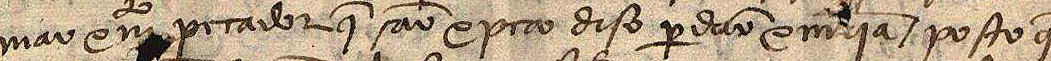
mao e mto pecador q̄ são e peco diso ꝑdaõ e mr̄ja / posto q̄
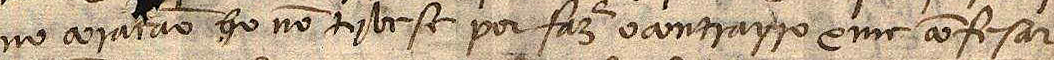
no coracão ho n̄o tyvese por faz̄ o contrayro e me c̄ofesar
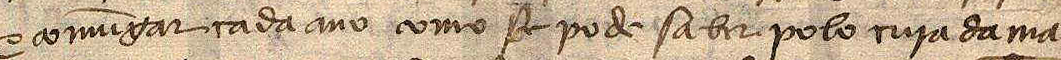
e com̄ugar cada ano como se pode saber polo cura da ma
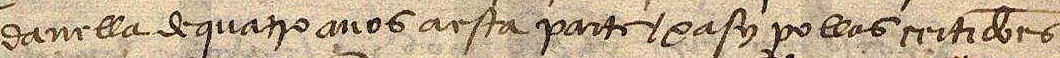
danella de quatro anos a esta parte / e asy pollas certidões
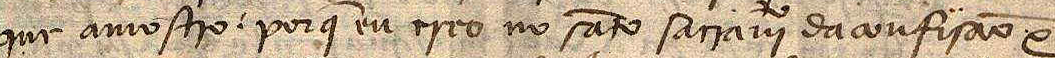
que amostro : por q̄ eu creo no s̄ato sacramto da confisaõ e
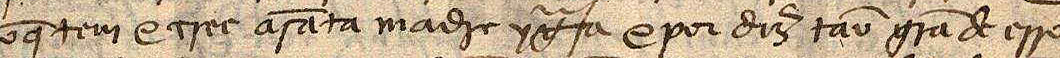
o q̄ tem e cree a s̄ata madre yḡJa e por diz̄ taõ grāde erro
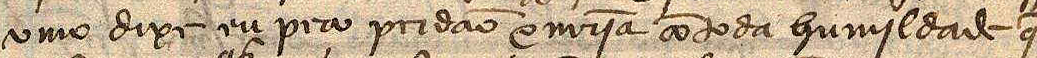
como dixe eu peço perdão e mr̄ja c̄o toda humjldade q̄
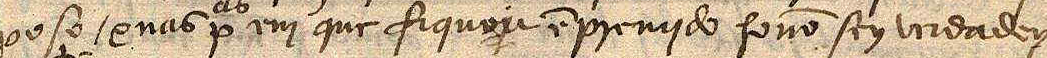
poso / e nas pas que fiquou ēpremjdo ho n̄o sey verdadey
